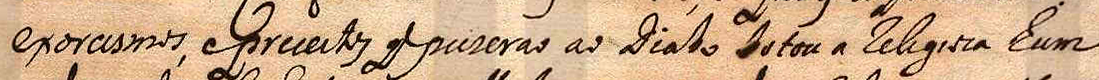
exorcismos, e preceitos q̄ puzerao ao Diabo botou a Religioza hum
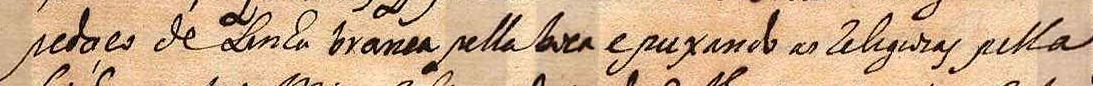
pedaço de Linha branca pella boca e puxando as Religiozas pella
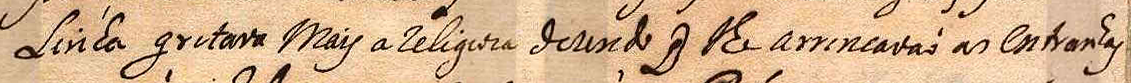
Linha gritava mais a Religioza dezendo q̄ lhe arrincavaõ as entranhas
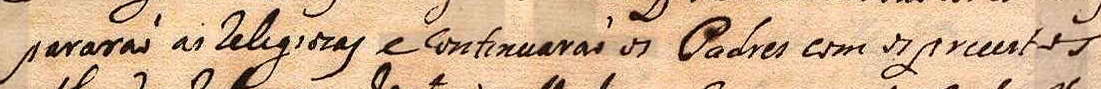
pararaõ as Religiozas e continuaraõ os Padres com os preceitos
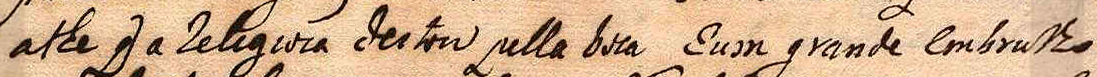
athe q̄ a Religioza deitou pella boca hum grande embrulho
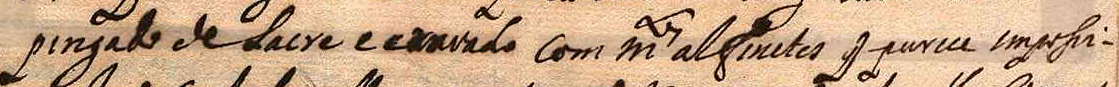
pingado de Lacre, e cravado com m.tos alfinetes q̄ parece impossi
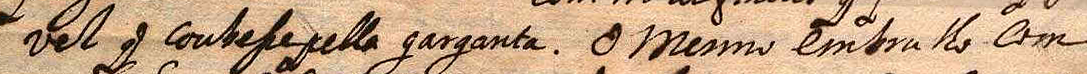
vel q̄ coubesse pella garganta. O mesmo embrulho com
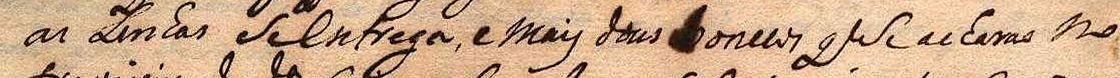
as Linhas se entrega, e mais dous bonecos q̄ se acharao no
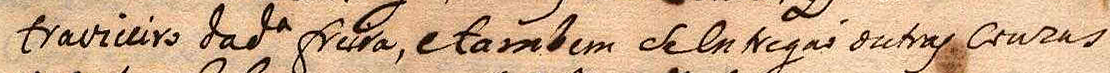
traviceiro da da freira, e tambem se entregaõ outras couzas
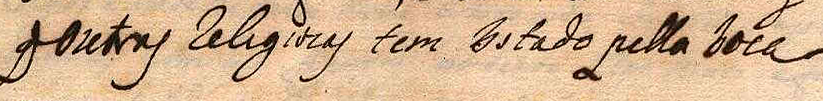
q̄ outras Religiozas tem botado pella boca
